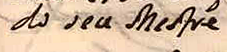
do seu Mestre
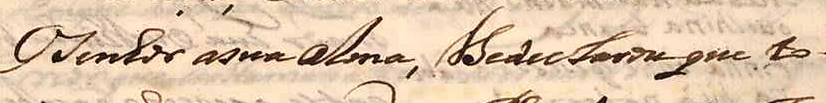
O Senhor a sua alma, lhe declarou que to
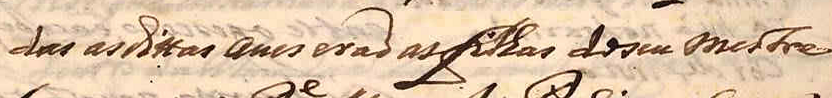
das as dittas aues erão as filhas do seu mestre
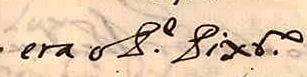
era o P.e Pixr.o
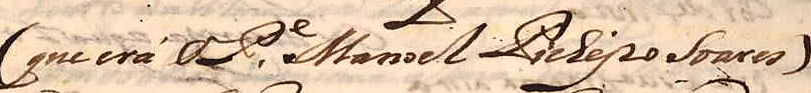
(que era o P.e Manoel Pichejro Soares)
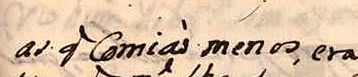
as q̄ comião menos, era
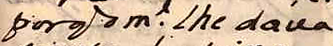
porq̄ o m.e lhe daua
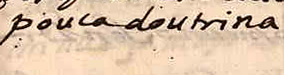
pouca doutrina
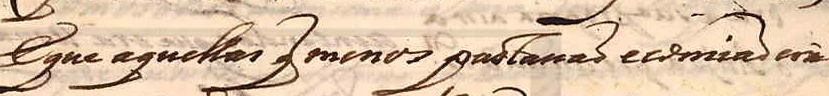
E que aquellas q̄ menos pastauaõ e comiaõ era
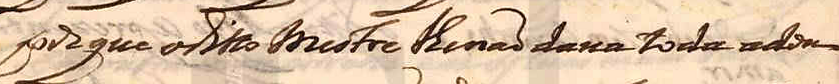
porque o ditto mestre lhe naõ daua toda a dou
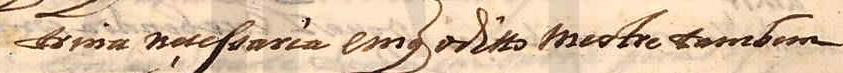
trina necessaria em q̄ o ditto mestre tambem
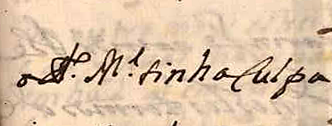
o d̄.o M.e tinha Culpa
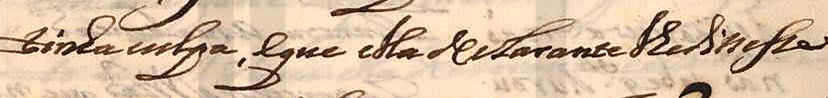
tinha culpa, e que ella declarante lhe dissesse
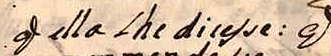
q̄ ella lhe dicesse: q̄
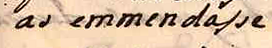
as emmendasse
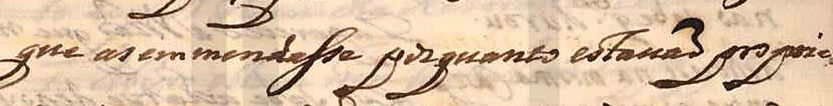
que as emmendasse porquanto estauaõ proprie
